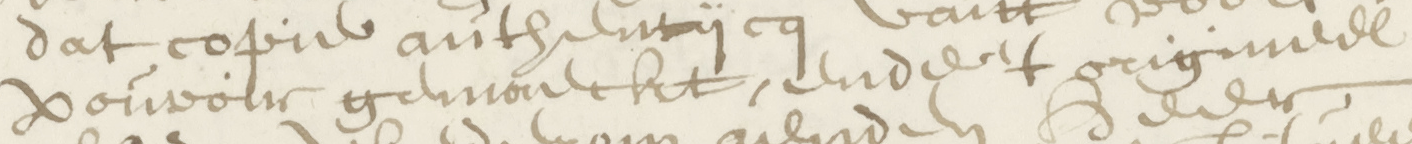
pouvoir gemaeckt, ende 't origineel
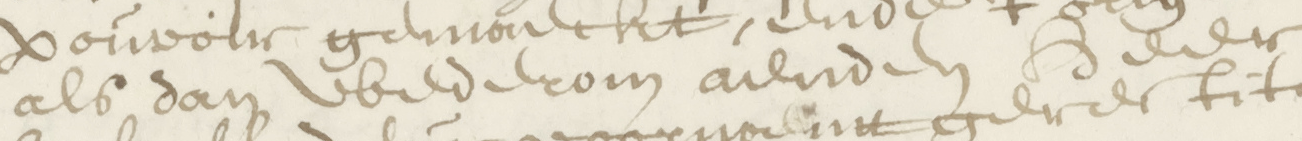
als dan wederom aenden Heer
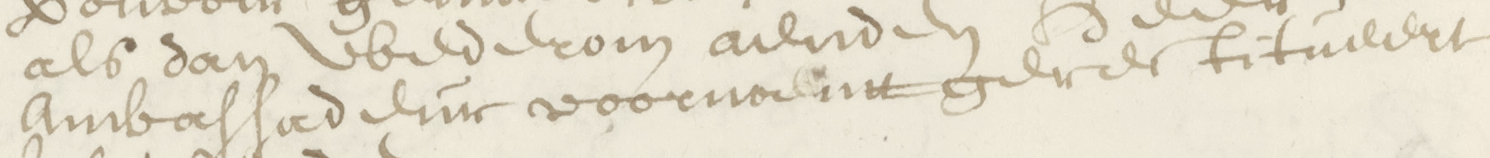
Ambassadeur voornoemt gerestitueert
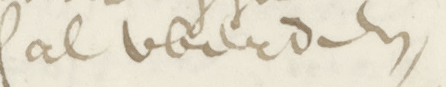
sal werden.
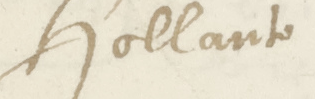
Hollant
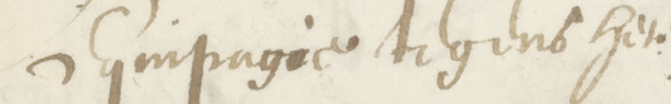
Equipagie tegens het
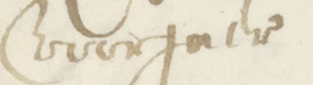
voorjaer
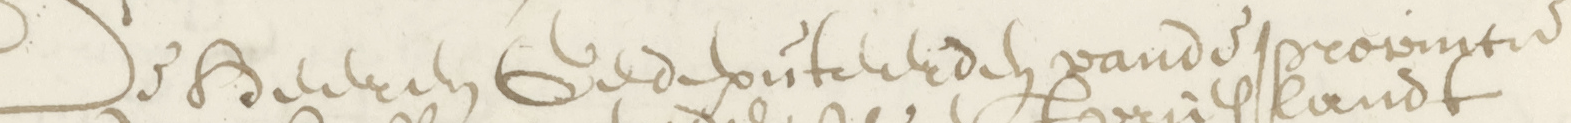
De Heeren Gedeputeerden vande provintie
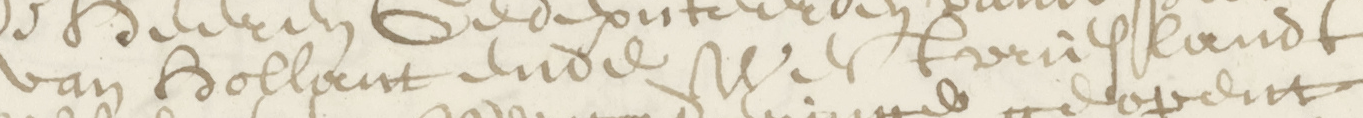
van Hollant ende Westvrieslandt
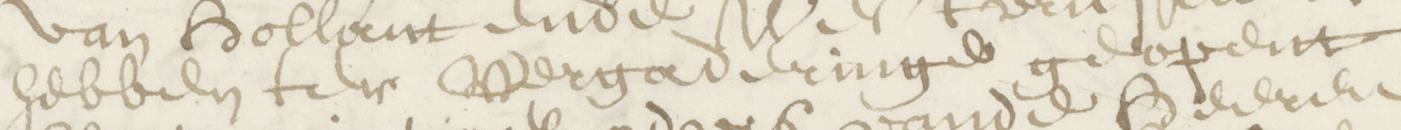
hebben ter Vergaderinge geopent
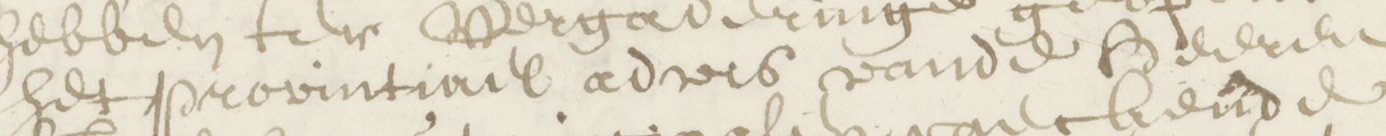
het provintiael advis vande Heeren
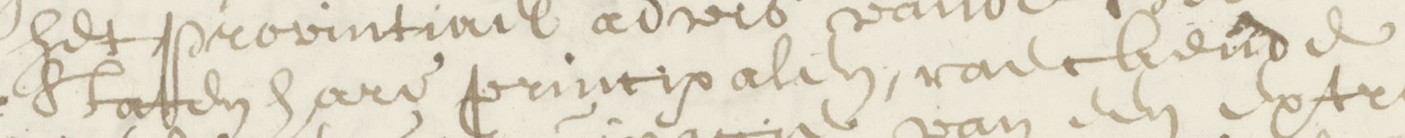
Staten hare principalen, raeckende
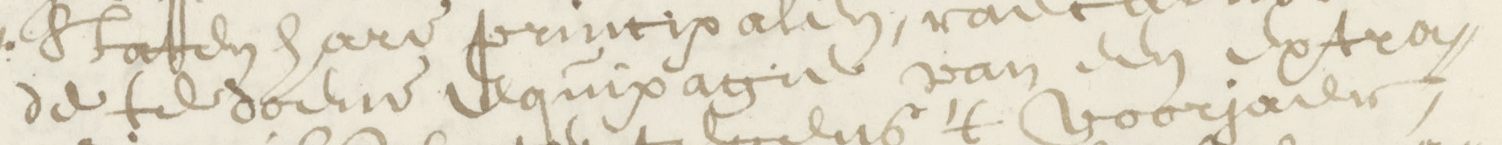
de te doene Equipagie van een Extra,,
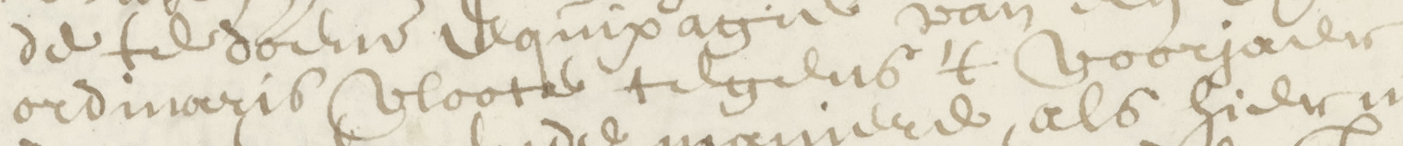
ordinaris vloote tegens 't voorjaer
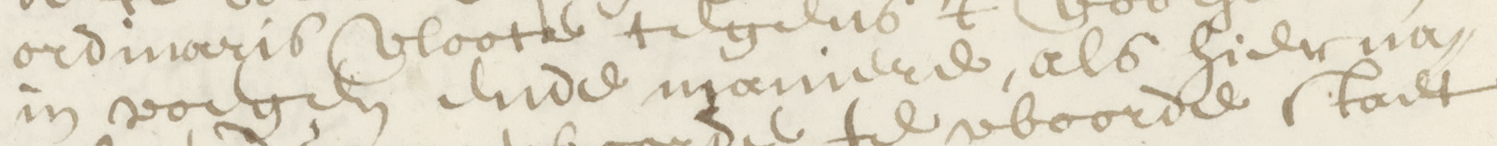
in voegen ende maniere, als hier na,,
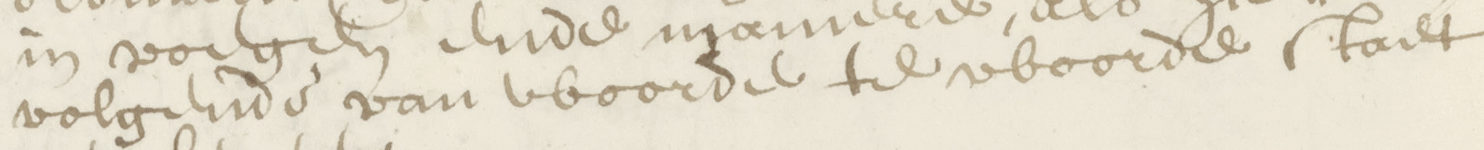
volgende van woorde te woorde staet
